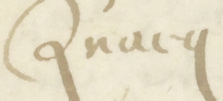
Quacq
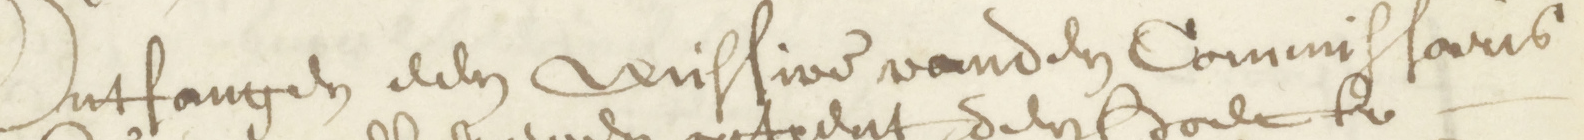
Ontfangen een missive vanden Commissaris
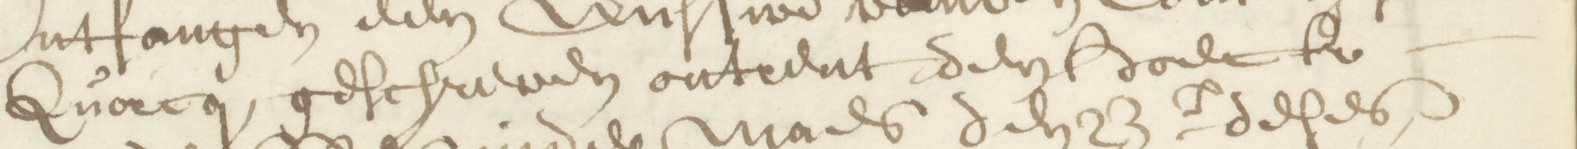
Quacq, geschreven ontrent den Hoeck —
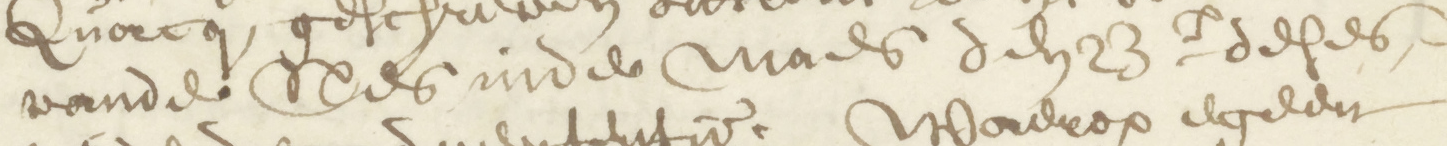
vande Nes inde Maes den 23e. deses,
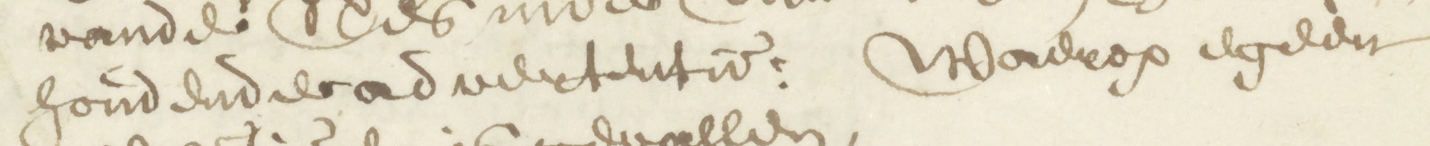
houdende advertentie: Waerop egeen
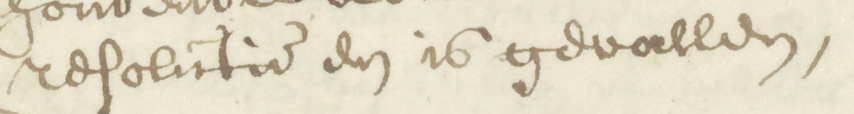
resolutie en is gevallen.
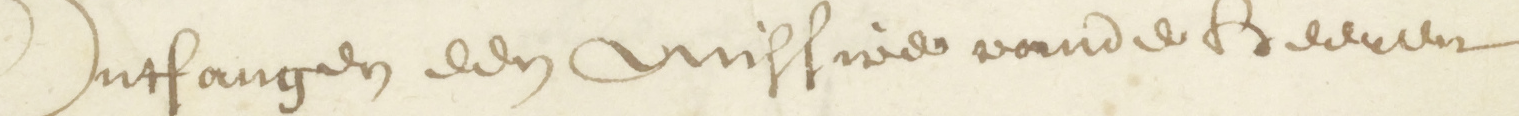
Ontfangen een missive vande Heeren
